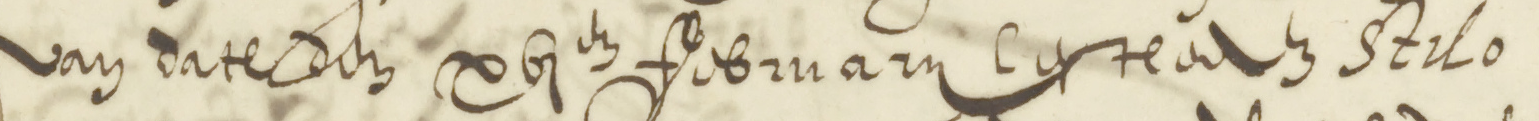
van date den xvien February lestleden stilo
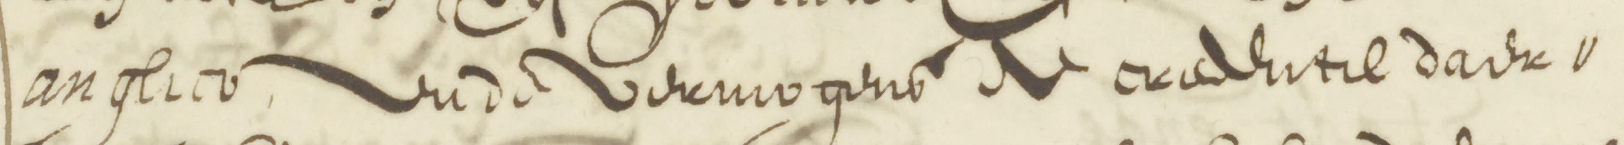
anglico ende vermogens de credentie daer„
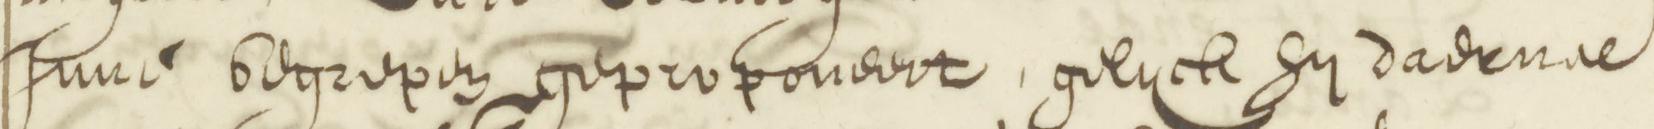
Inne begrepen geproponeert, gelyck hy daerinne
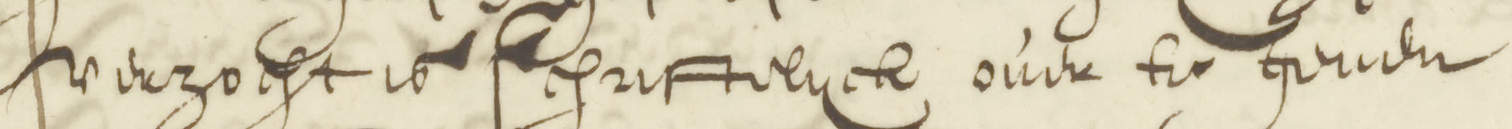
verzocht is schriftelyck ouer te geuen
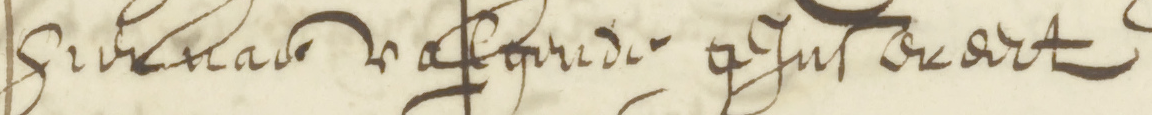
hiernae volgende geInsereert
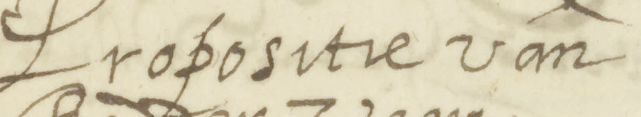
Propositie van
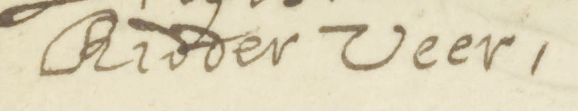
Ridder Veer,
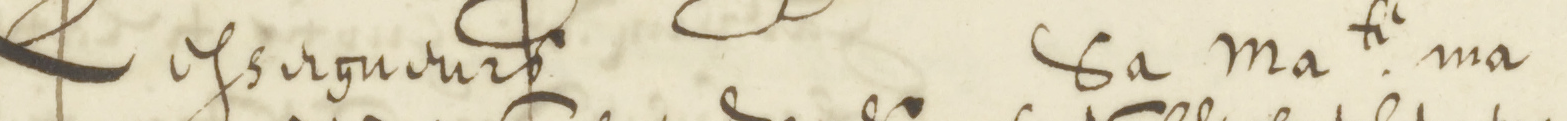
Messeigneurs Sa Mate. ma
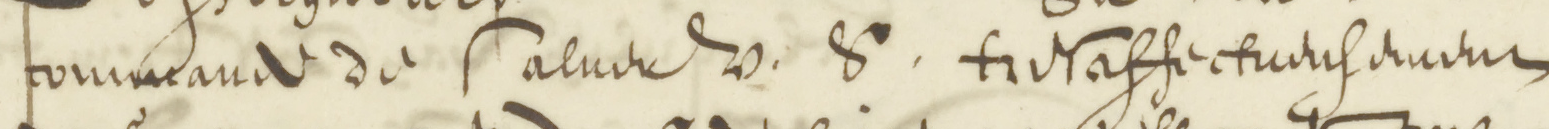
commande de saluer V. S. tres affectueusement
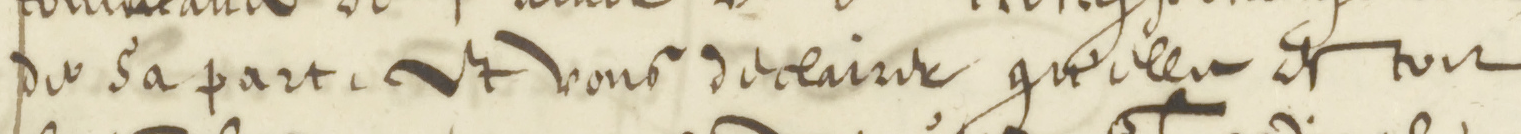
de sa part, et vous declairer qu‛elle estoit
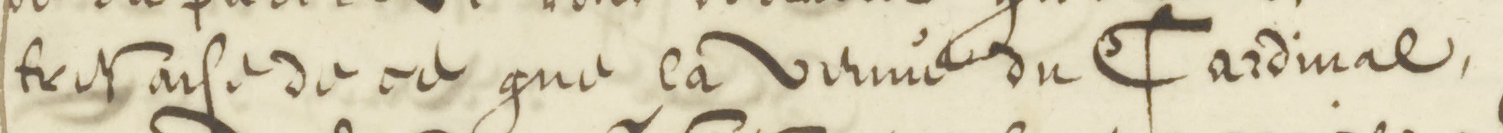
tres aise de ce que la venue du Cardinal,
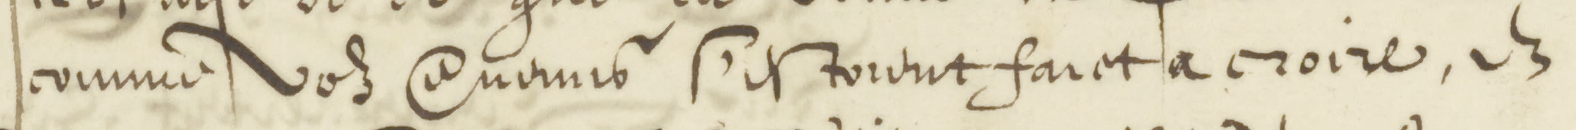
comme voz enemis s‛estoient faict a croire, et
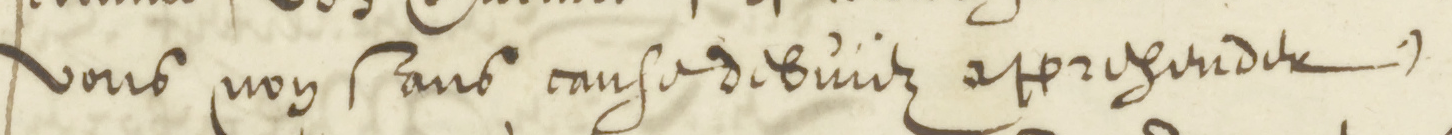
vous non sans cause debuiez apprehender
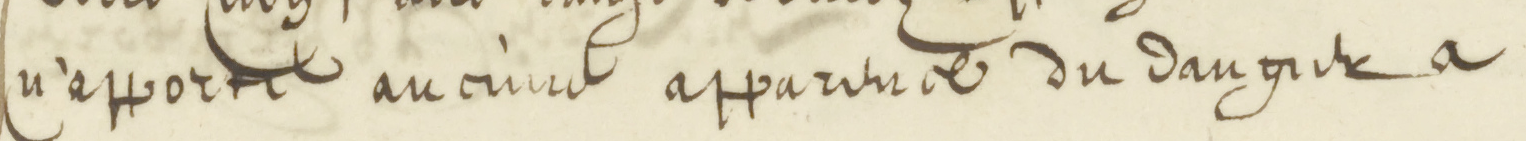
n‛apporte aucune apparence du dangier a
